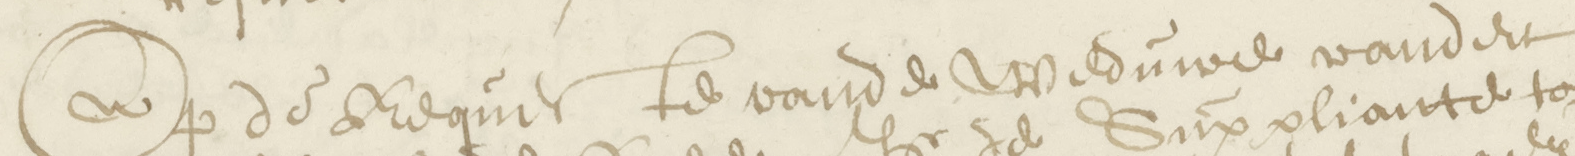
Op de Requeste vande weduwe vanden
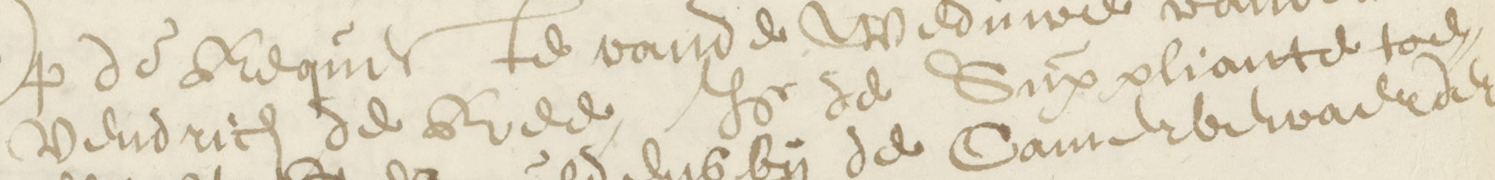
Vendrich de Ree. Is de Suppliante toe„
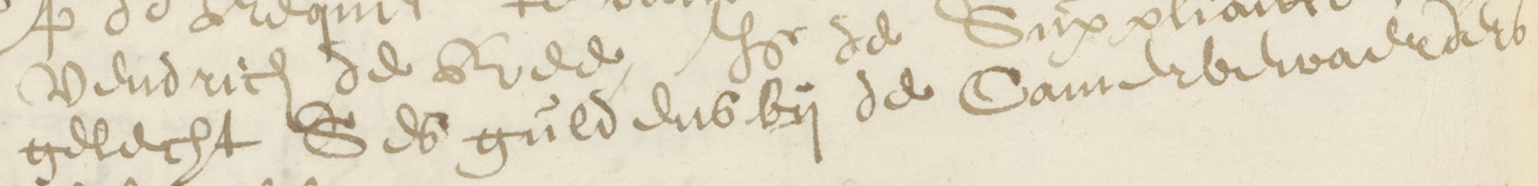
gelecht Ses guldens bij de Camerbewaerders
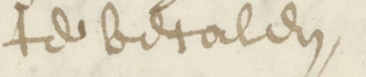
te betalen.
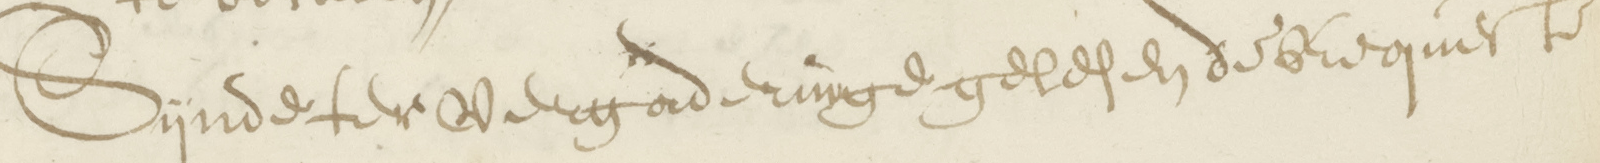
Sijnde ter Vergaderinge gelesen de Requeste
